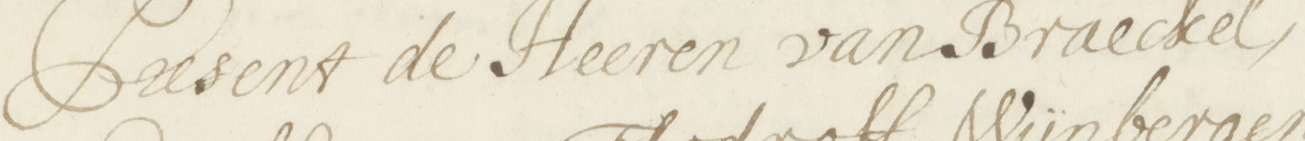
Present de Heeren van Braeckel,
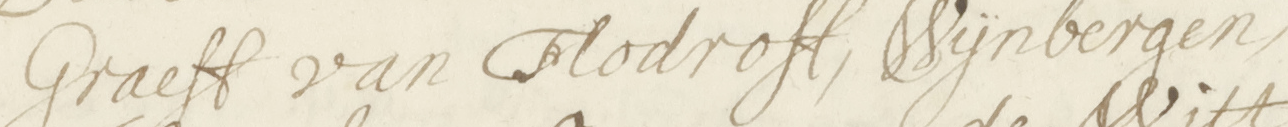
Graeff van Flodroff, Wijnbergen,
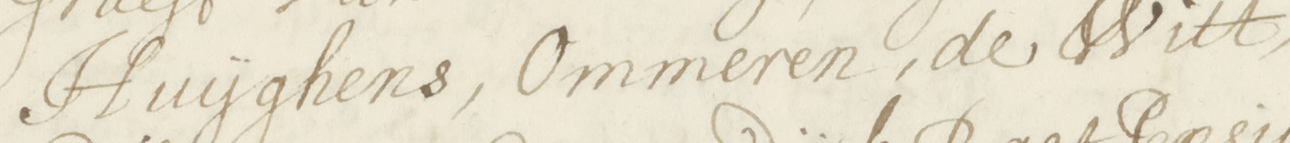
Huijghens, Ommeren, de Witt,
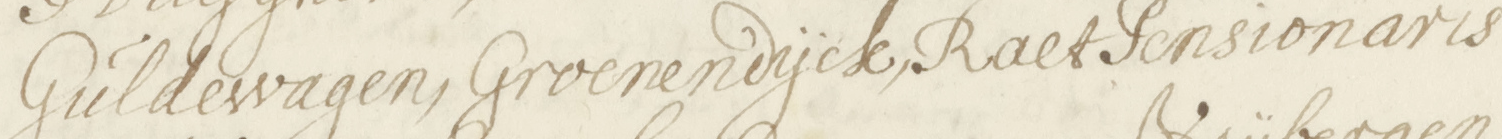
Guldewagen, Groenendijck, Raet Pensionaris
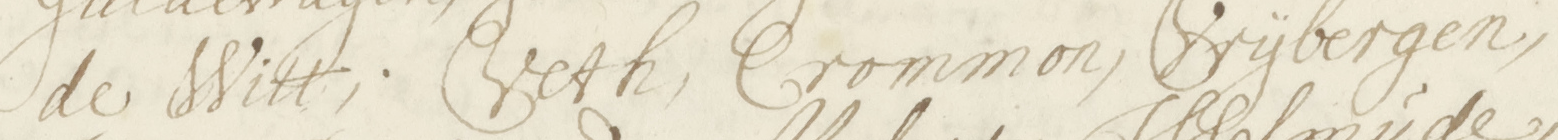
de Witt, Veth, Crommon, Vrijbergen,
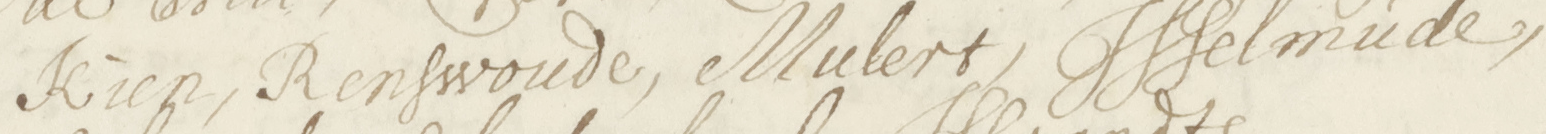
Kien, Renswoude, Mulert, Isselmude,
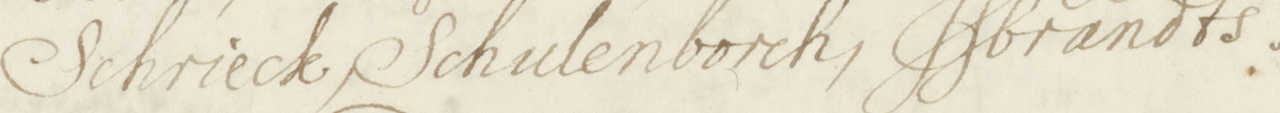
Schrieck, Schulenborch, Isbrandts.
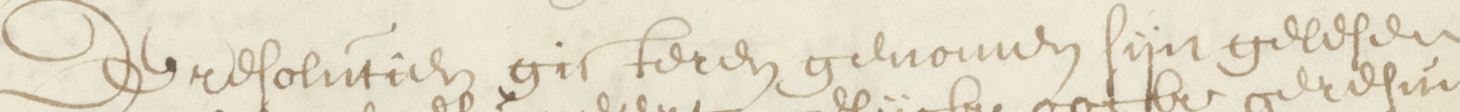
D'resolutien gisteren genomen sijn gelesen
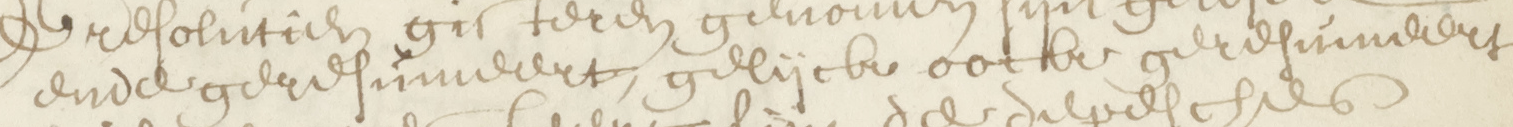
ende geresumeert, gelijck oock geresumeert
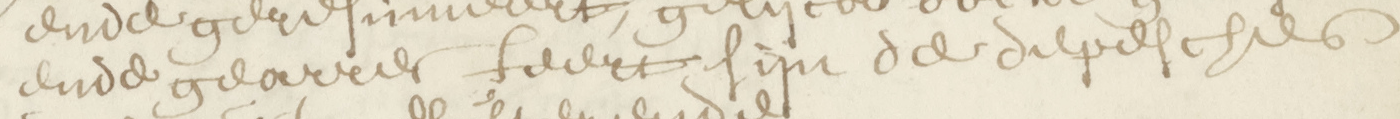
ende gearresteert sijn de depesches
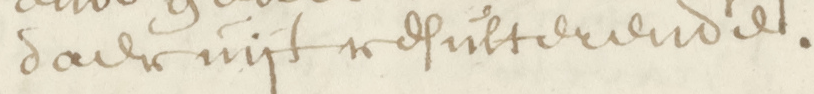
daeruijt resulterende.
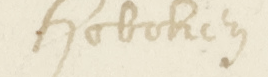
Hoboken.
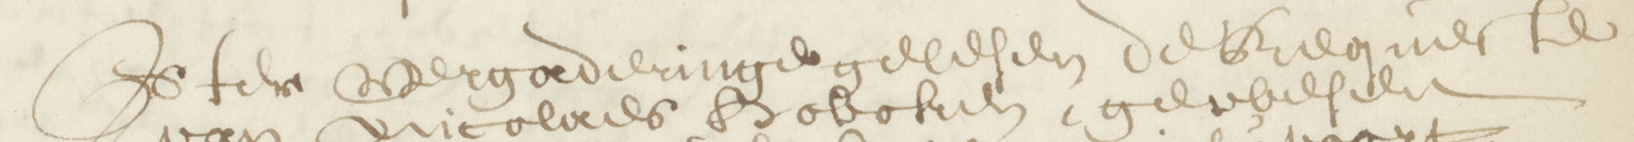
Is ter vergaderinge gelesen de Requeste
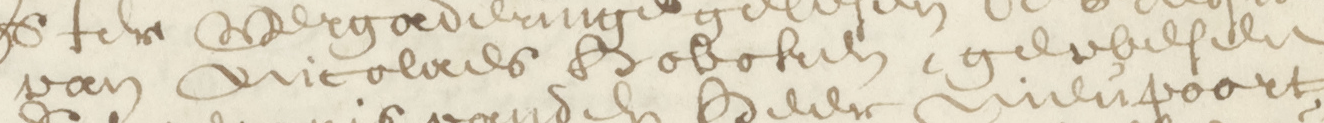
van Nicolaes Hoboken, gewesen
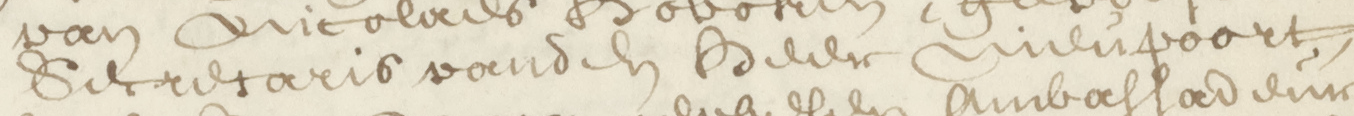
Secretaris vanden Heer Nieupoort,
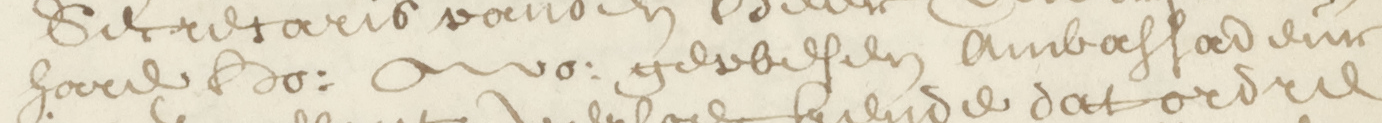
hare Ho:Mo: gewesen Ambassadeur
